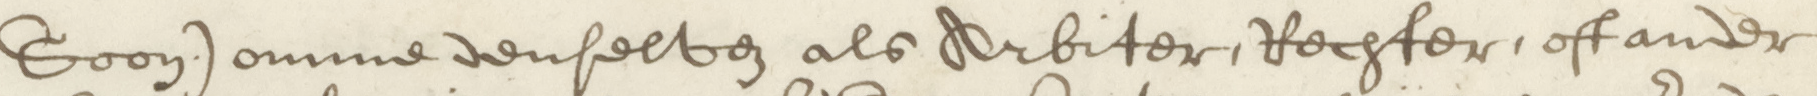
Soon) omme denselven als Arbiter, Rechter oft ander
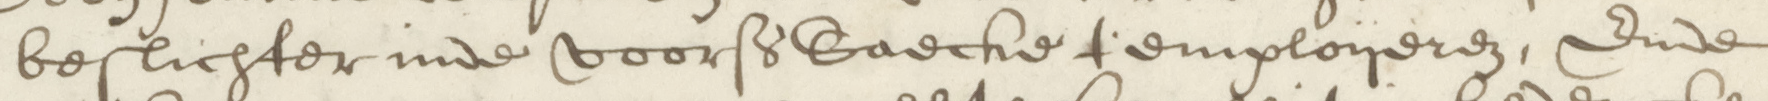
beslichter in de voorsz Saecke t‛emploijeren. Ende
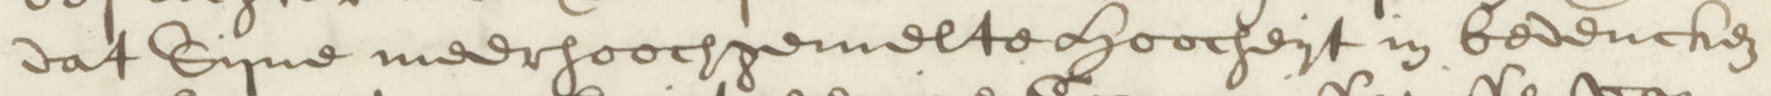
dat Sijne meerhoochgemelte Hoocheijt in bedencken
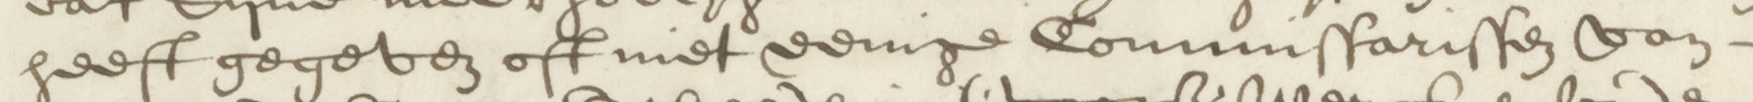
heeft gegeven oft niet eenige Commissarissen van —
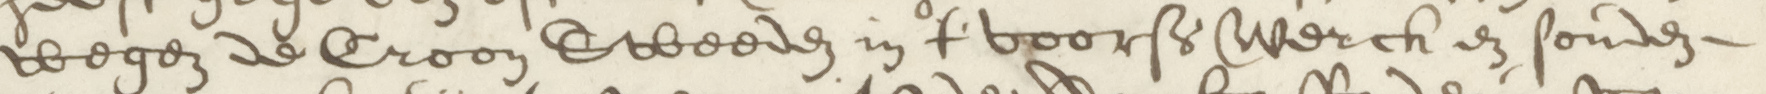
wegen de Croon Sweeden in t‛ voorsz werck en souden —
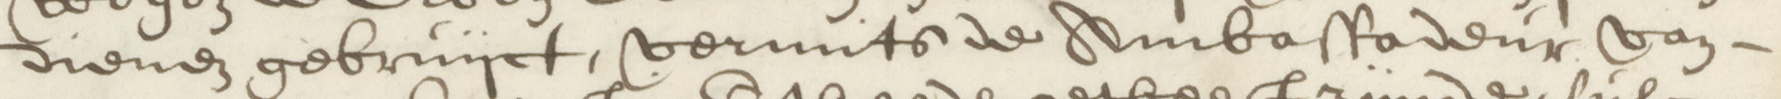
dienen gebruijct, vermits de Ambassadeur van —
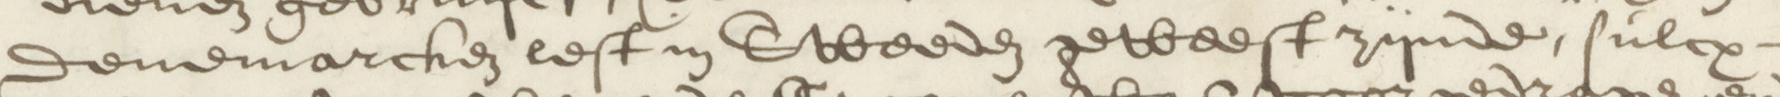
Denemarcken lest in Sweeden geweest zijnde, sulcx —
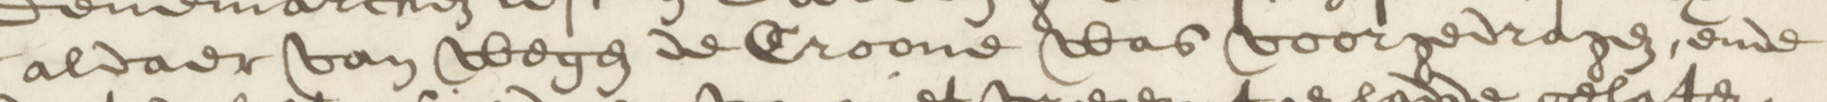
aldaer van wegen de Croone was voorgedragen, ende
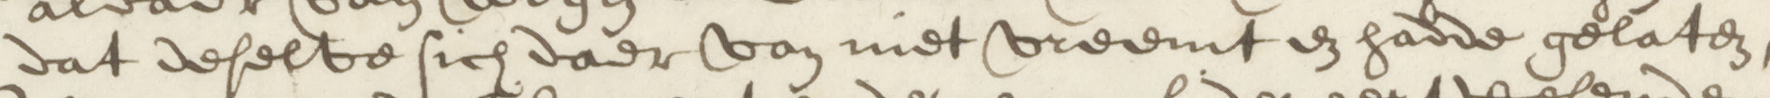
dat deselve sich daer van niet vreemt en hadde gelaten,
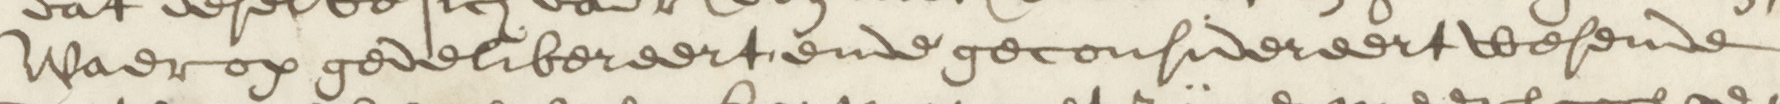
Waerop gedelibereert ende geconsidereert wesende
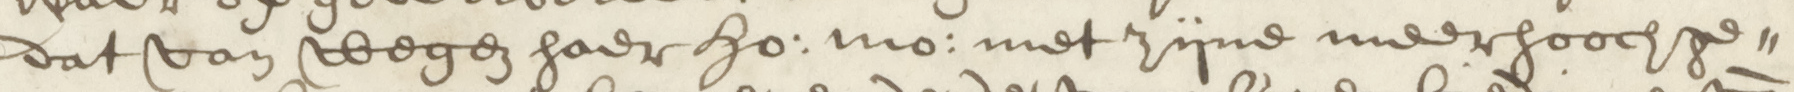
dat van wegen haer Ho:mo: met zijne meerhoochge„
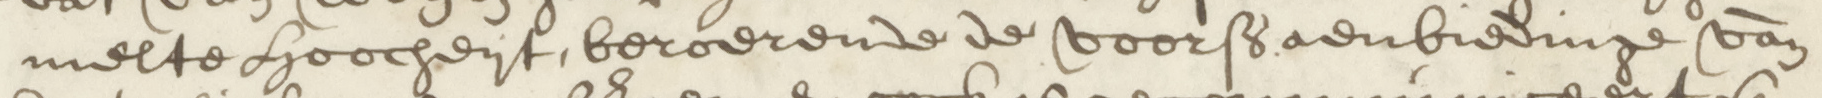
melte Hoocheijt, beroerende de voorsz aenbiedinge van
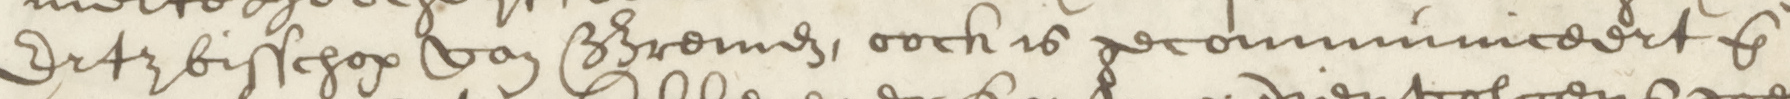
Ertzbisschop van Bremen, oock is gecommuniceert &
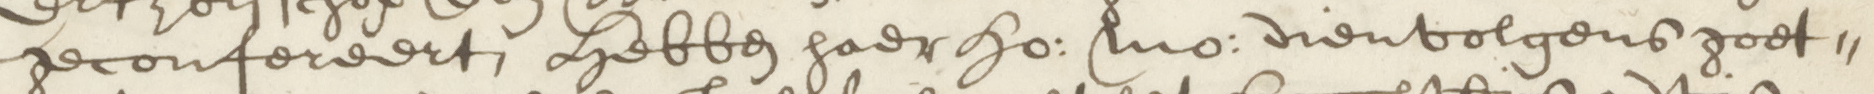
geconfereert, Hebben haer Ho:Mo: dienvolgens goet„
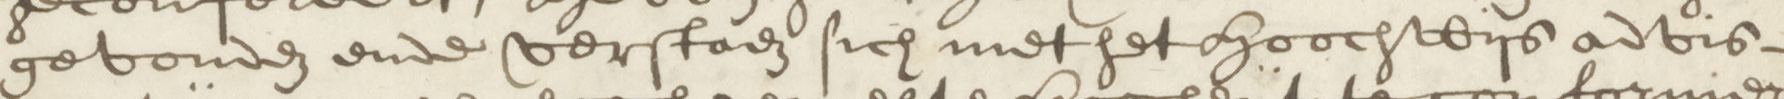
gebonden ende verstaen sich met het Hoochwijs advis
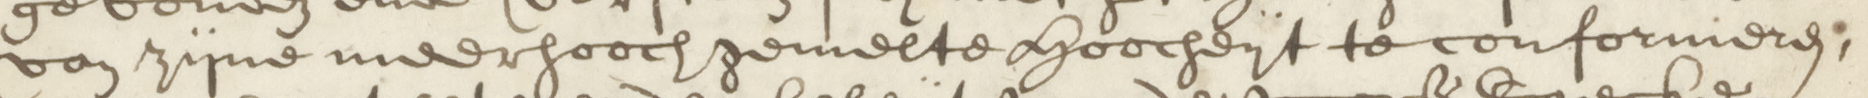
van zijne meerhoochgemelte Hoocheijt te conformeren,
